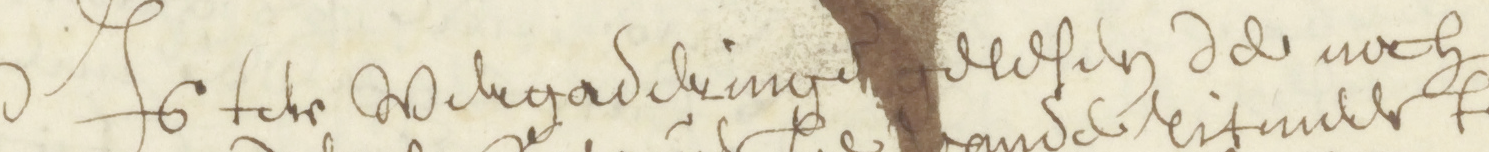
Is ter Vergaderinge gelesen de noch
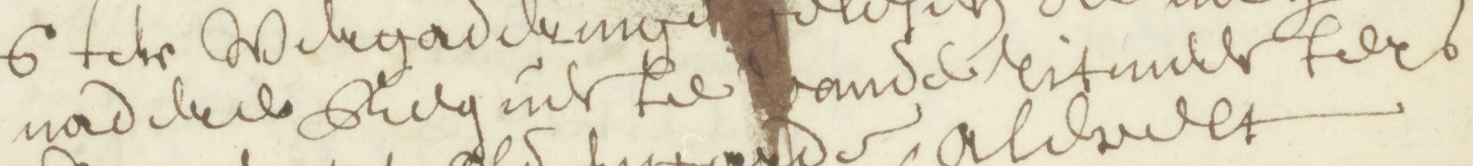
nadere Requeste vande ritmeesters
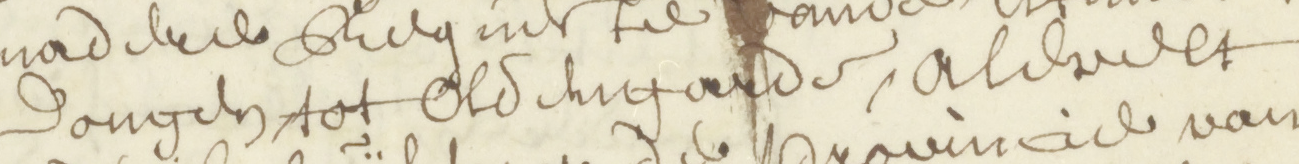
Dongen tot Oldengarde, Alevelt
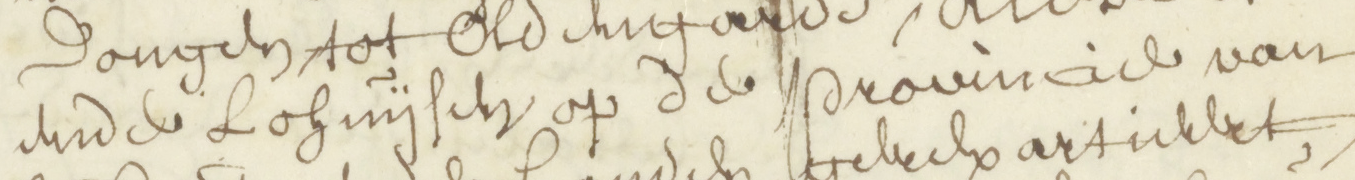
ende Lohuijsen, op de Provincie van
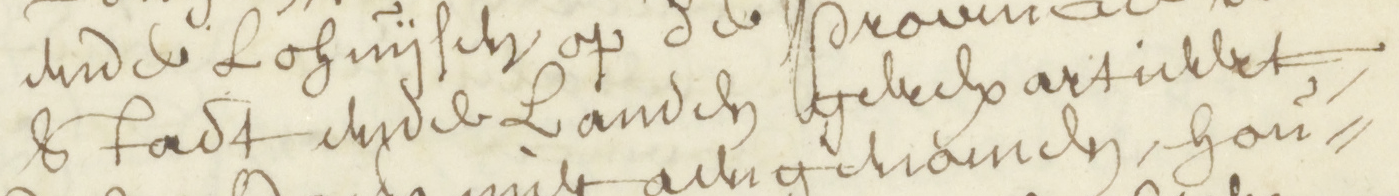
Stadt ende Landen gerepartieert,
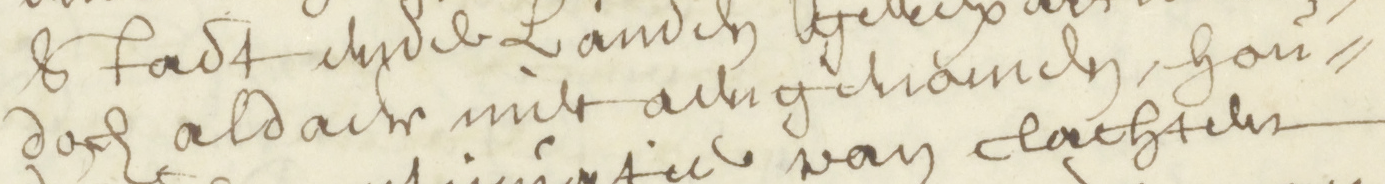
doch aldaer niet aengenomen, hou„
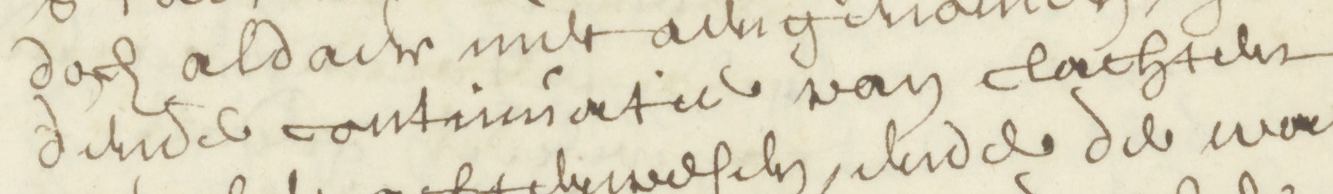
dende continuatie van clachten
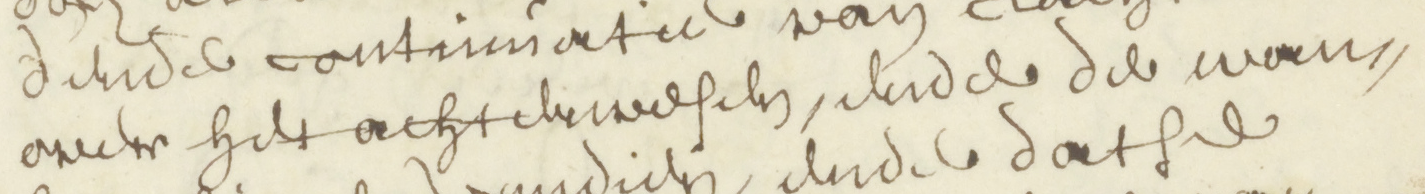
over het achterwesen, ende de wan„
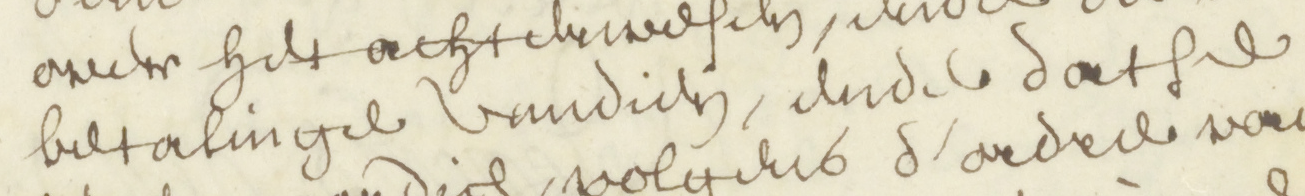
betalinge vandien, ende datse
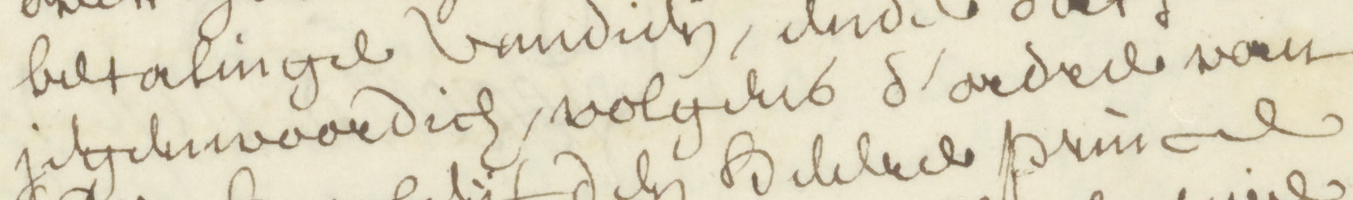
jegenwoordich, volgens d'ordre van
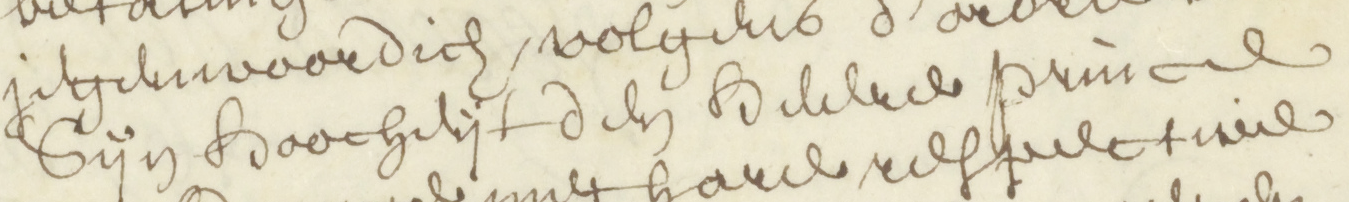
Sijn Hoocheijt den Heere Prince
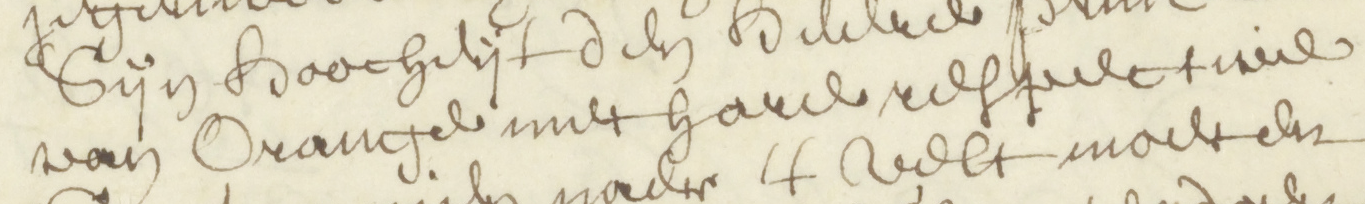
van Orange met hare respective
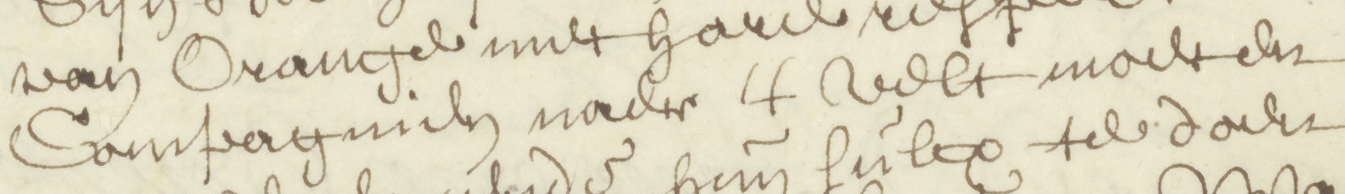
Compagnien naer 't velt moeten
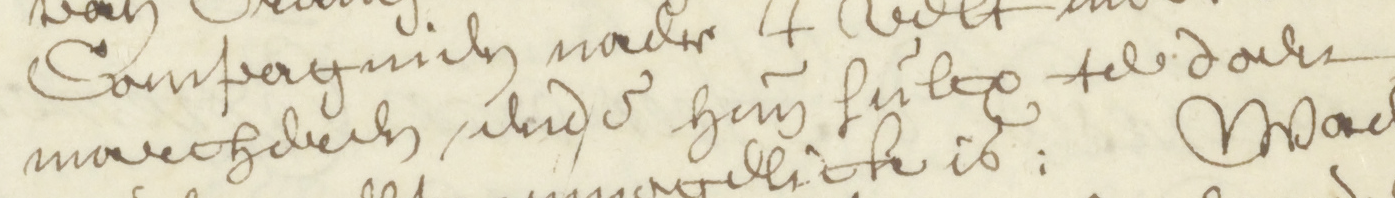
marcheren, ende hun sulcx te doen,
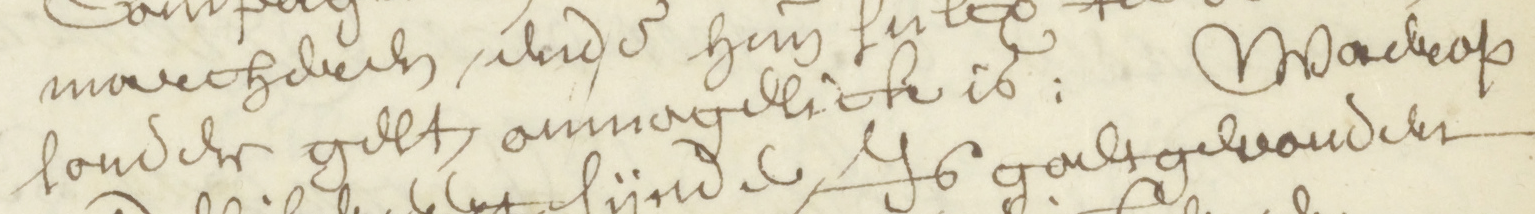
sonder gelt, onmogelick is: Waerop
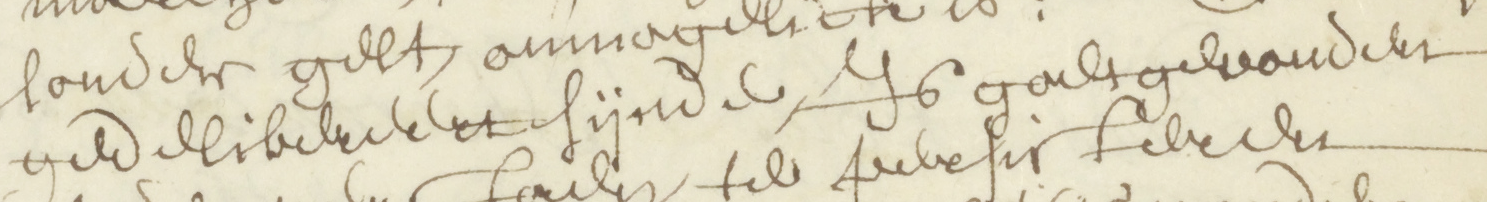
gedelibereert sijnde, Is goetgevonden
